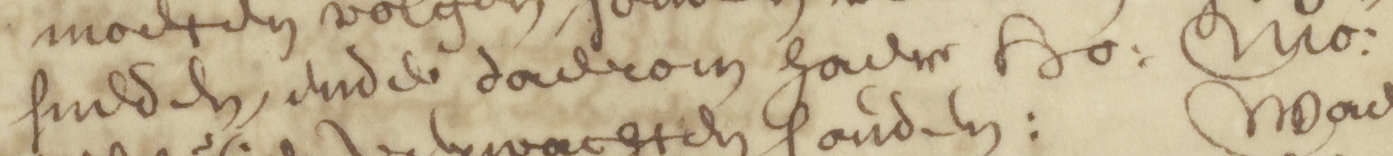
sneden, ende daerom haer Ho:Mo:
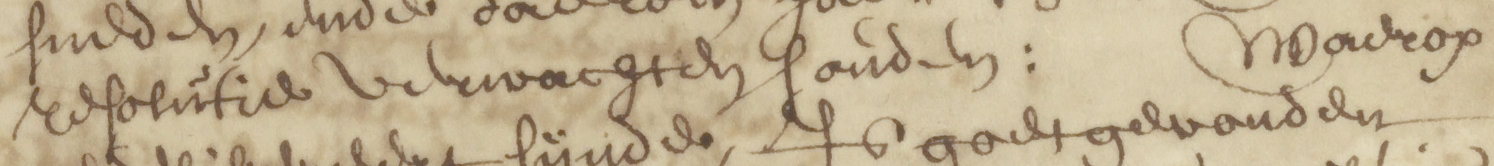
resolutie verwachten souden: Waerop
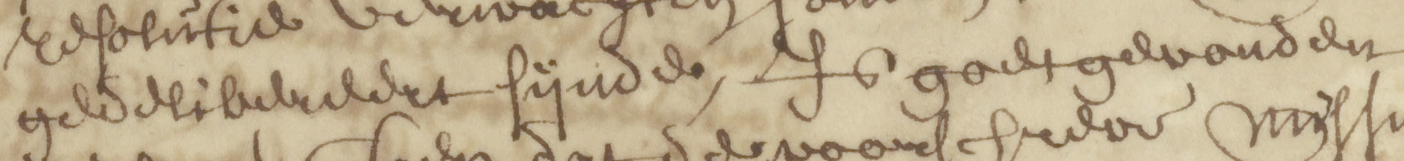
gedelibereert sijnde, Is goetgevonden
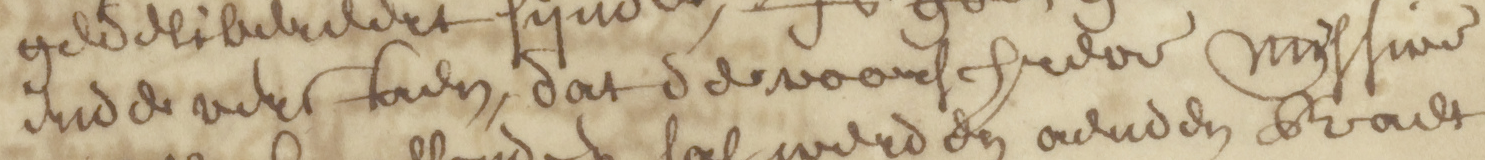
ende verstaen, dat de voorschreve Missive
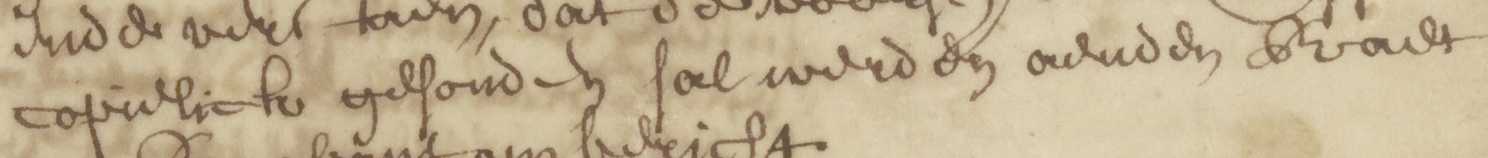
copielick gesonden sal werden aenden Raet
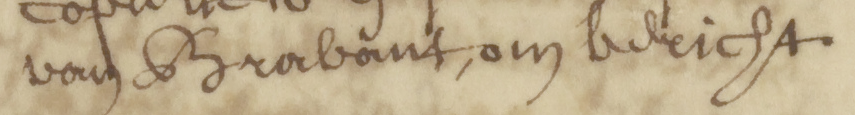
van Brabant, om bericht
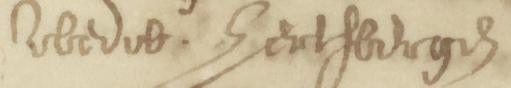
Wedwe, Hertsbergen
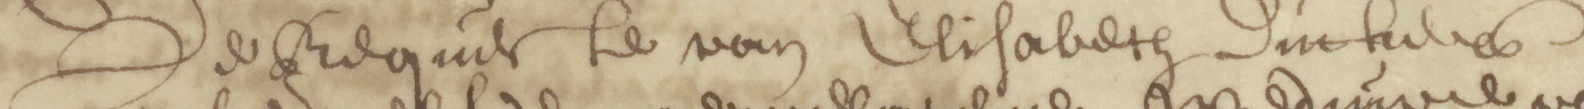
De Requeste van Elisabeth Duckers
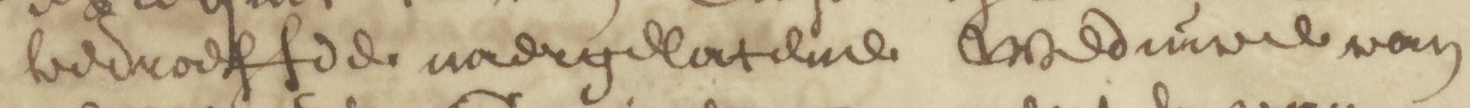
bedroefffde naergelatene Weduwe van
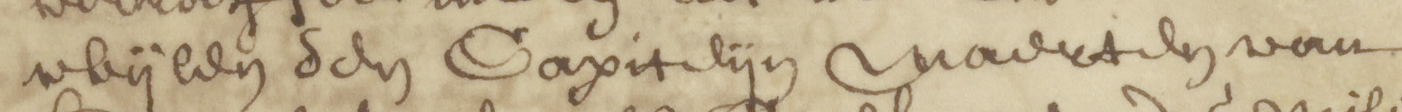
wijlen den Capiteijn Maerten van
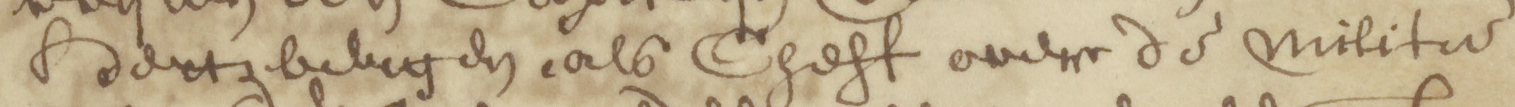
Hertsbergen als Cheff over de militie
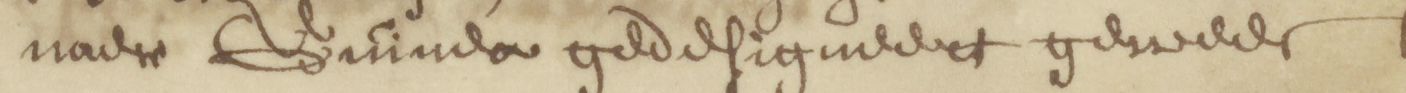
naer Guinea gedesigneert geweest
